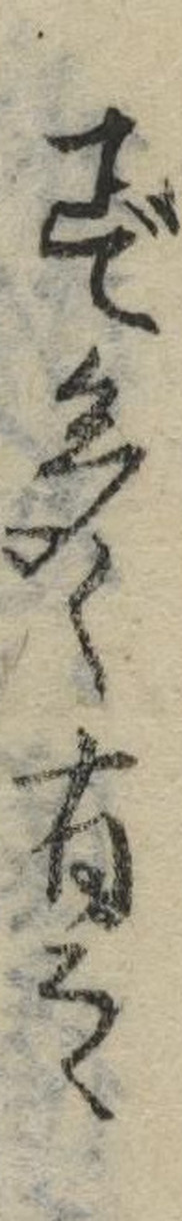ず多く有之
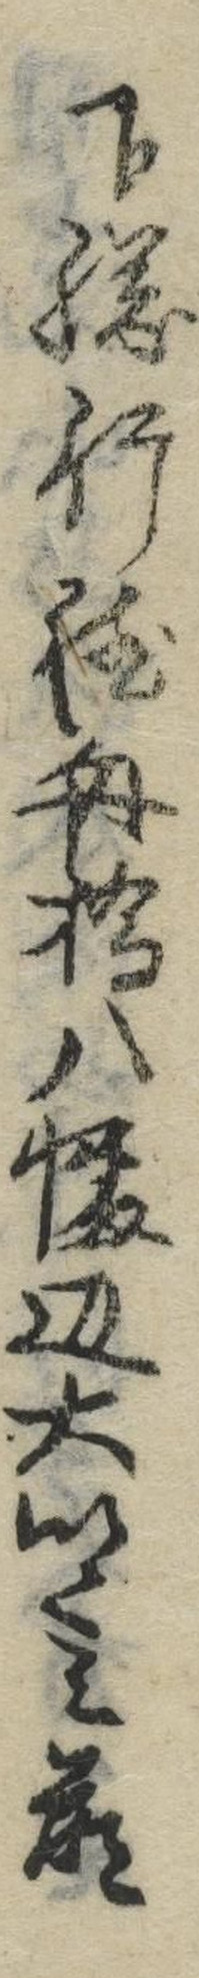下総行徳舟橋八幡辺大いたミ崩
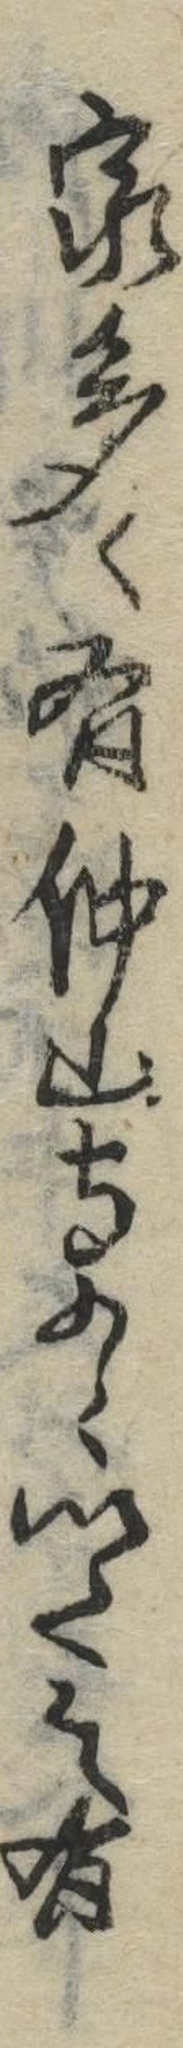家多く有仲山寺少〻いたミ有
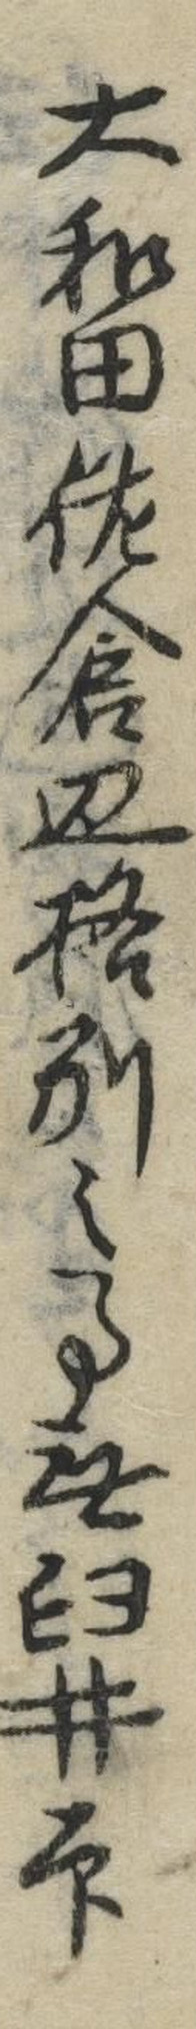大和田佐倉辺格別之事無臼井印
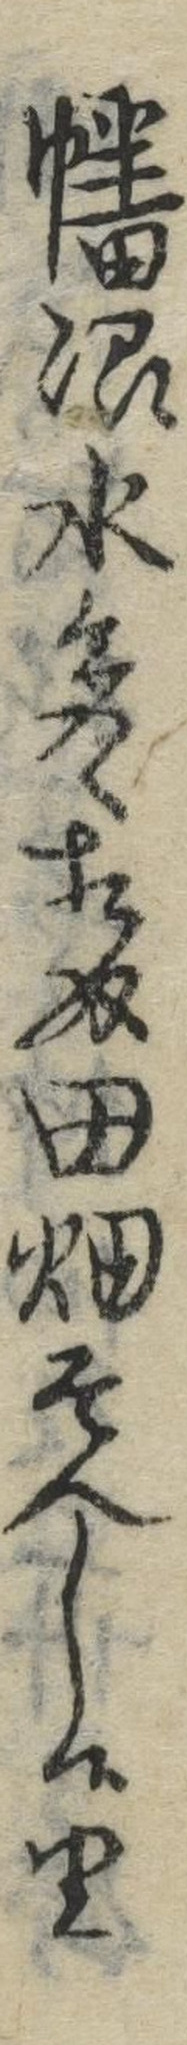幡沼水多く相成田畑そんし候由
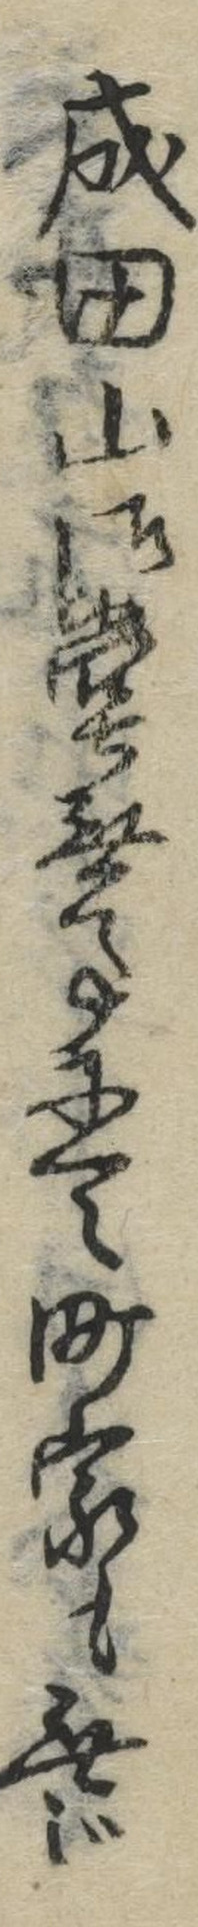成田山御堂無事にて町家も無じ
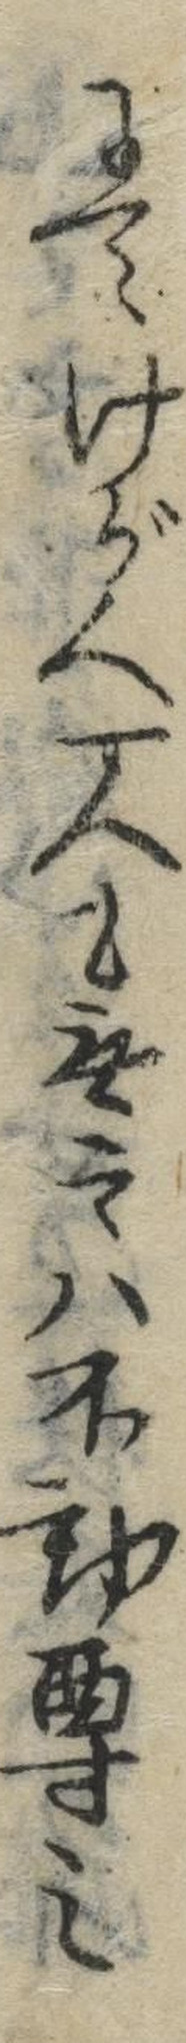にてけが人一人も無之ハ不動尊之
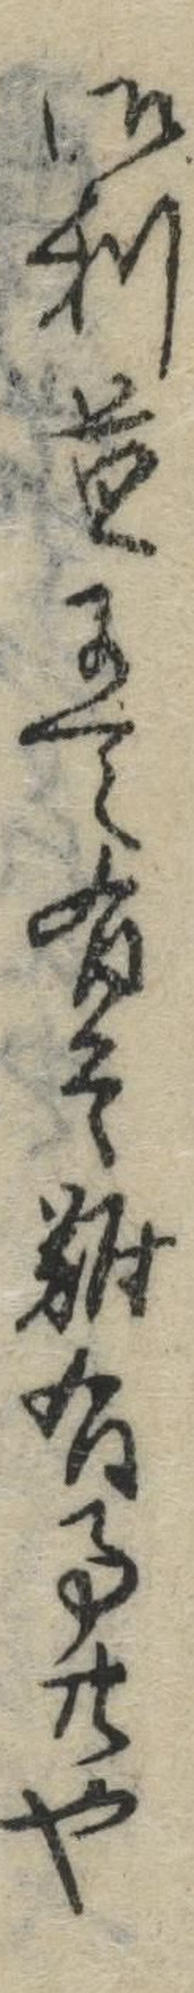御利益にて有之難有事共也
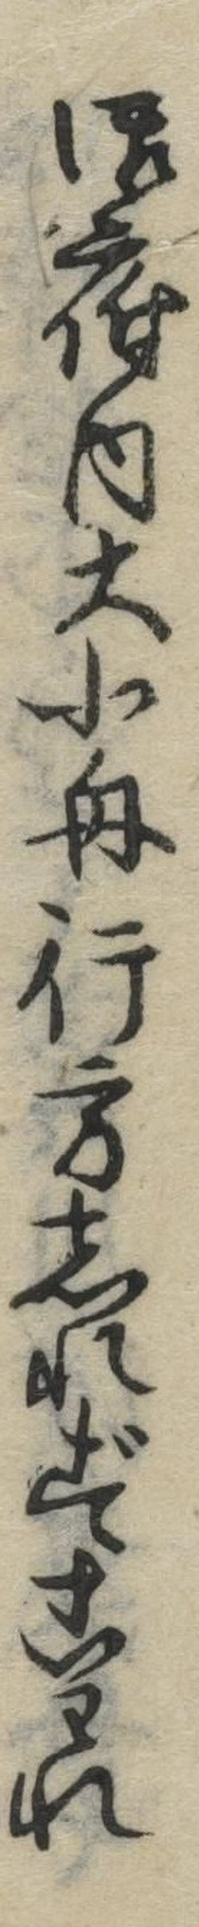御府内大小舟行方しれずこわれ
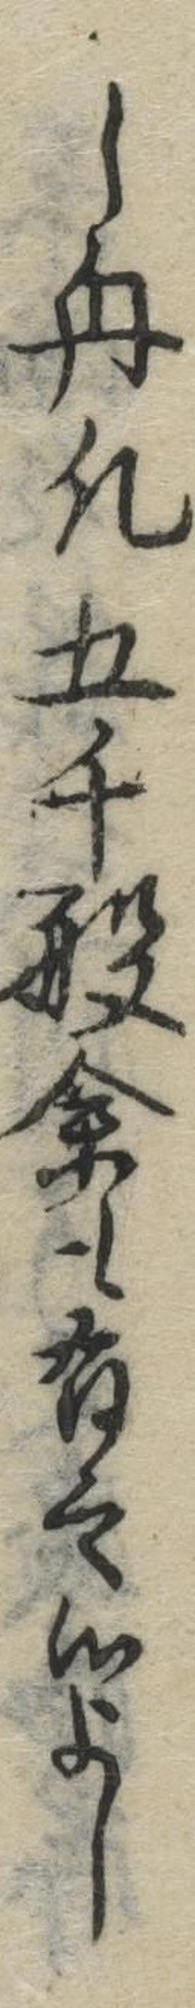し舟凡五千艘余も有之候よし
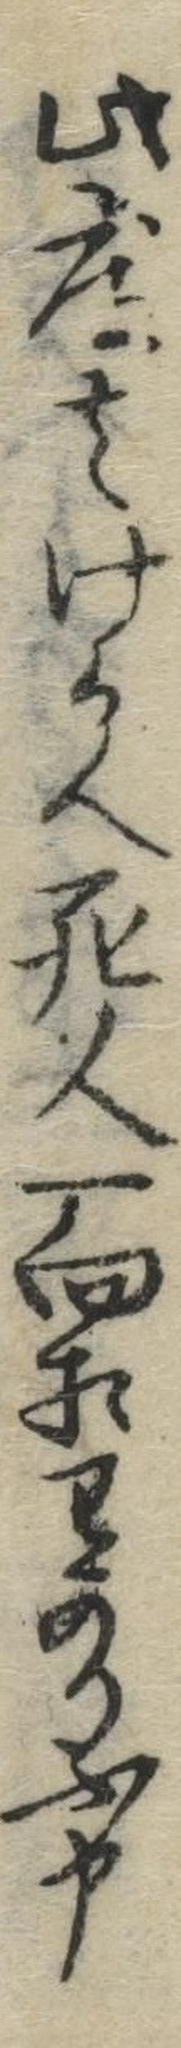此処はけが人死人一向相わかり不申
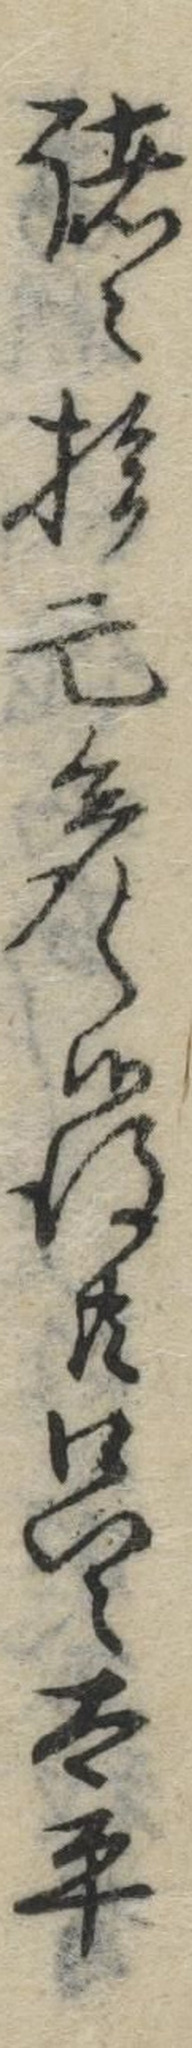諸〻損亡多く候得共只〻太平
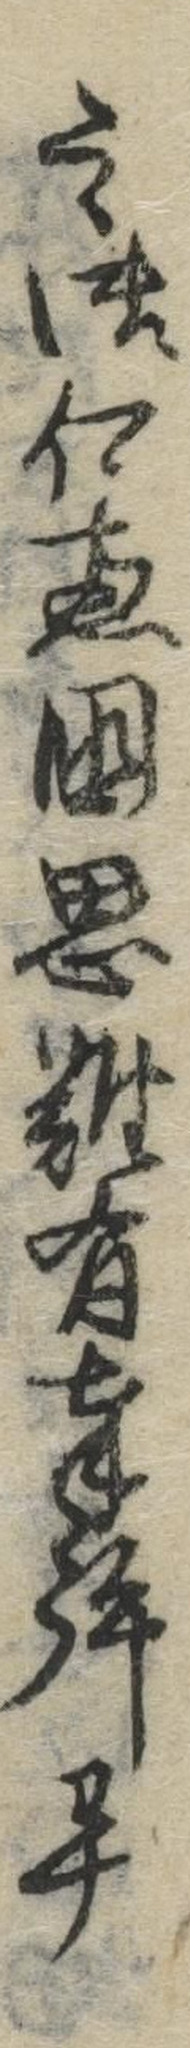之御仁恵国思難有奉拝畢
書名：安政三年辰八月廿五日夜　大江都御屋敷方寺社市中共　大嵐水入場所明細書之寫　并街道筋近郷聞書
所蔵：東京大学地震研究所図書室 Earthquake Research Institute Library, The University of Tokyo, JAPAN
